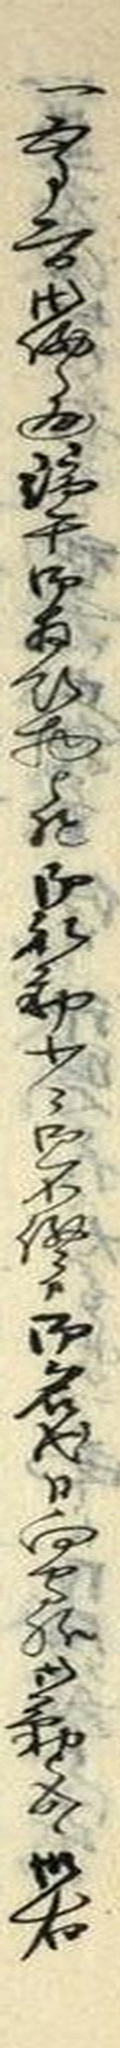一五月二日御例之通端午御拝領物被遊御礼勤少々御不例ニ付御名代日向守様御勤被成候御右
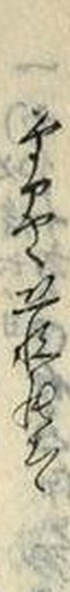筆部屋へ恐悦罷出候
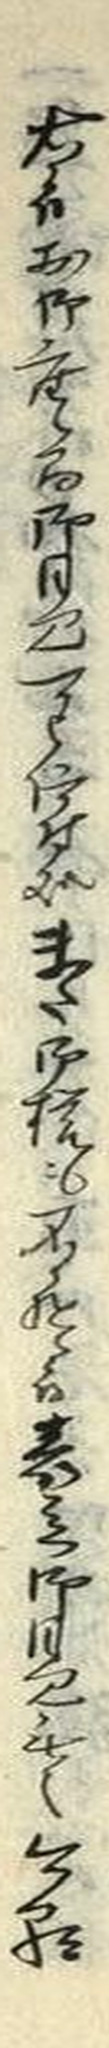右ニ付於御座之間御目見可被仰付候処また御櫛も不被遊候ニ付表立御目見無之今朝
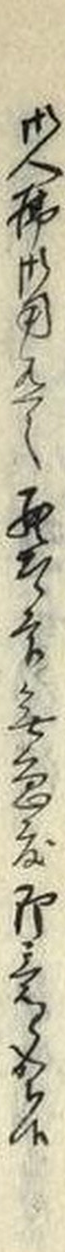御人払御用有之罷出候節無急度御意被成下候
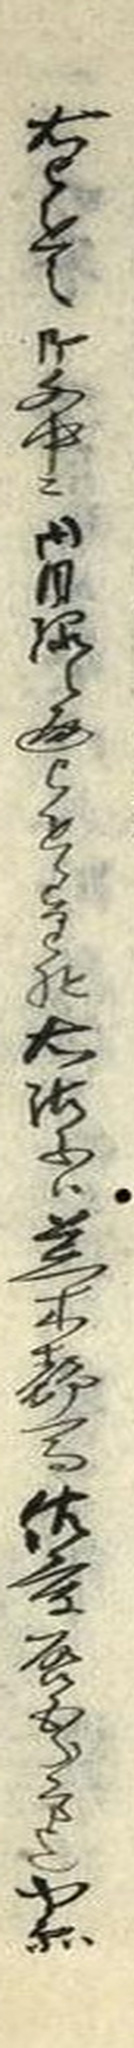右被進之御文中ニ御目録之通被進候旨被遊右銀子ハ荒木静馬佐藤啓五郎方迄小兵衛
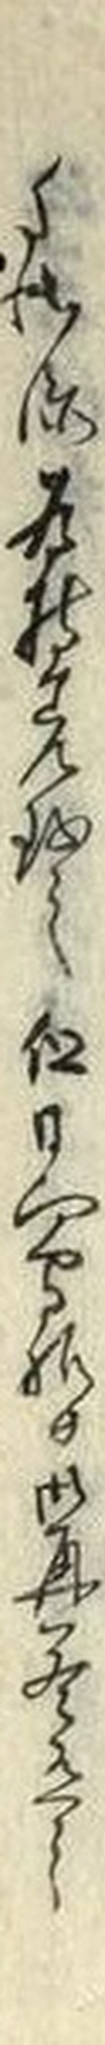手紙添為持差越之但日向守様ゟ御再答有之

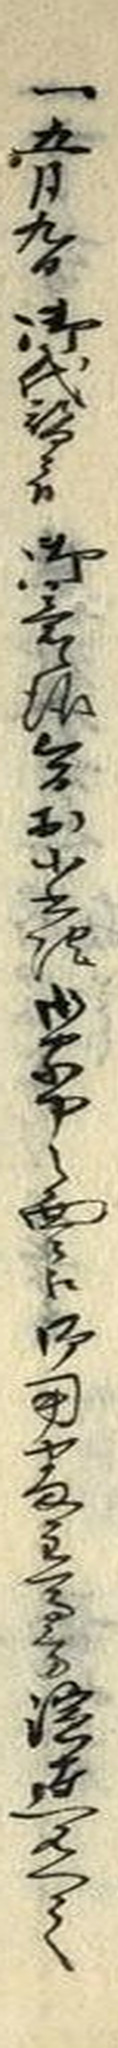一五月九日御代替ニ付御意之趣今日於小書院御家中之面々江御用番主馬方演達有之
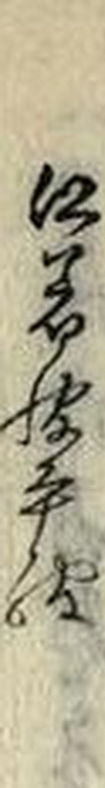但着服平服
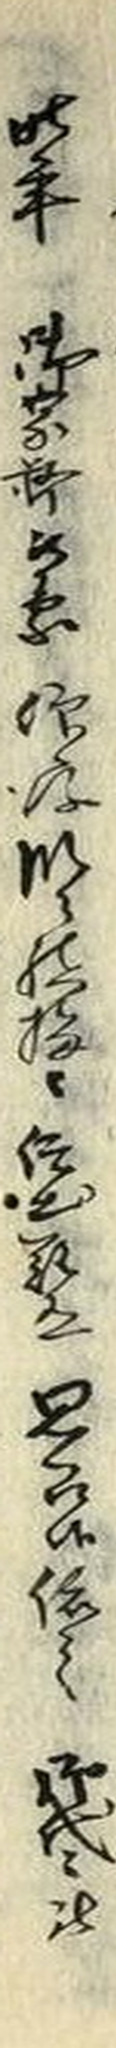昨年御家督被蒙仰候後段々結構被仰出難有思召候依之御代々被
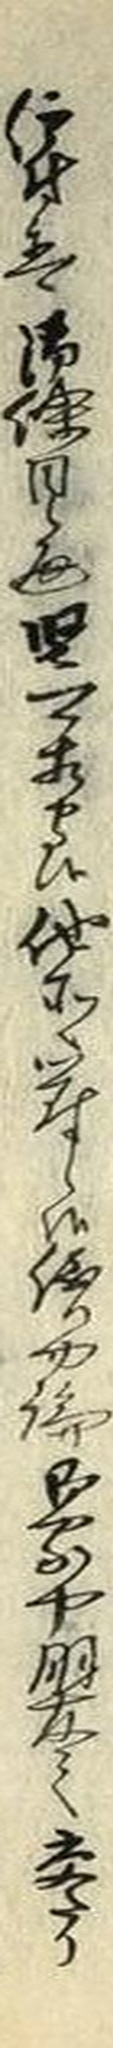仰付置候御條目之通堅可相守候他所へ対し候儀御ハ勿論御家中朋友之交たり
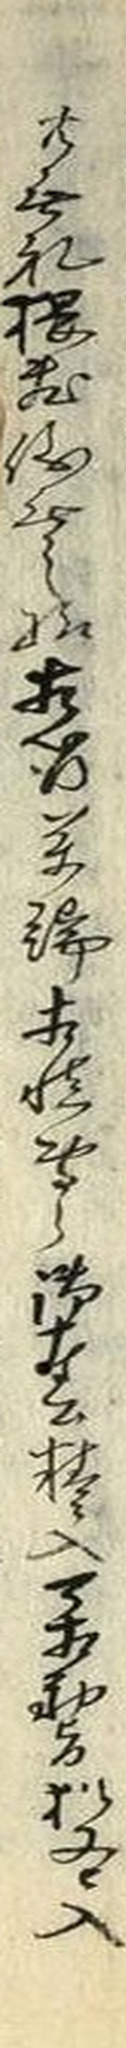共無礼猥敷儀無之様相心得万端相慎専ら御奉公精ニ入可相勤旨猶又被入
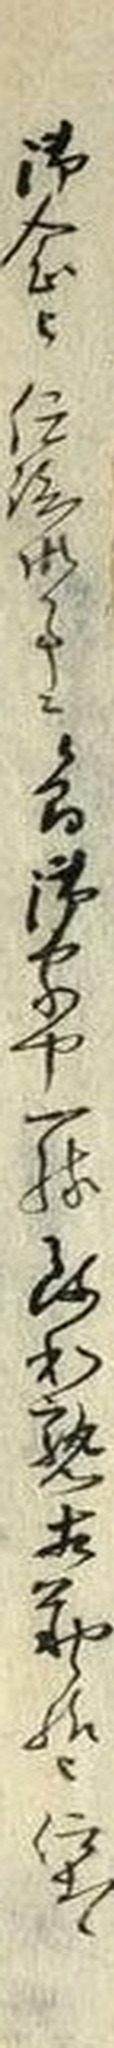御念被仰渡御事ニ候間御家中一統致和熟相勤候様被仰出候
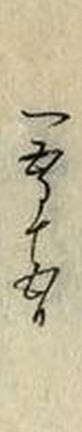一五月廿七日
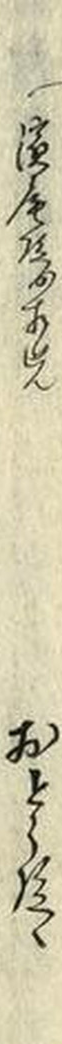浜尾殿ゟ相廻ル野村殿へ
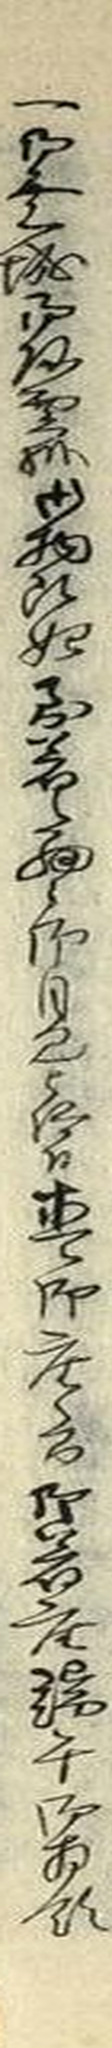一御登城御帰殿掛御物頭始到着之面々御目見被仰付直ニ御座之間御着座端午御拝領
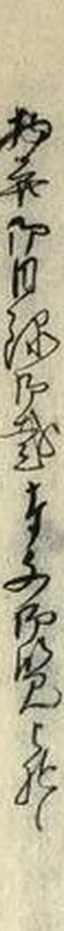物幷御目録御戴奉文御覧被遊候
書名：少傅日録抄（斉善付側向頭取日記、在府）
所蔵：福井県文書館 Fukui Prefectural Archives
